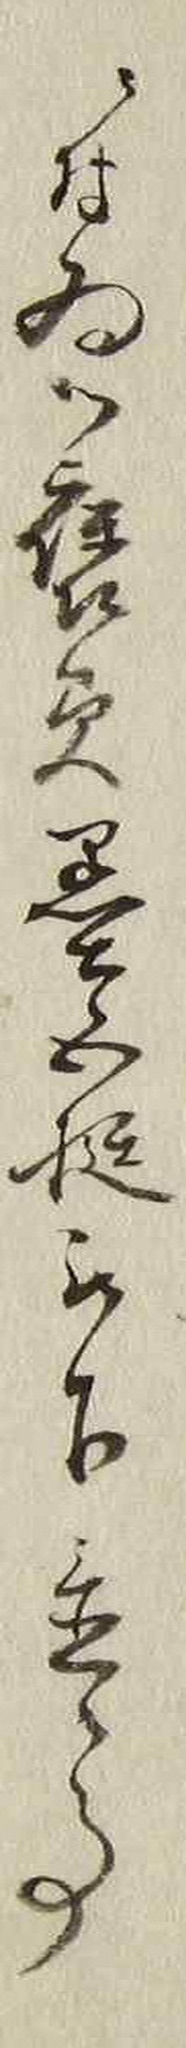ニ付為御褒美墨五挺被下置候事
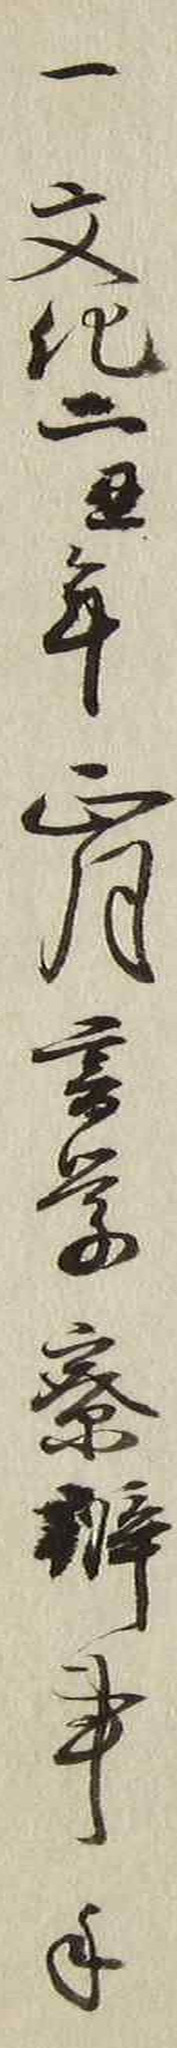一文化二丑年正月書寮弁事手
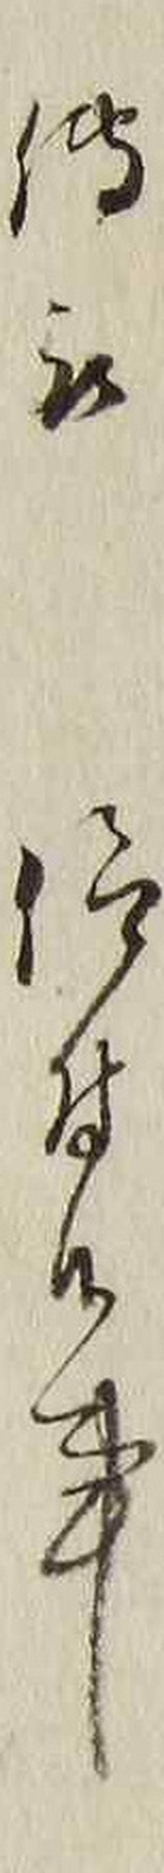伝被仰付候事
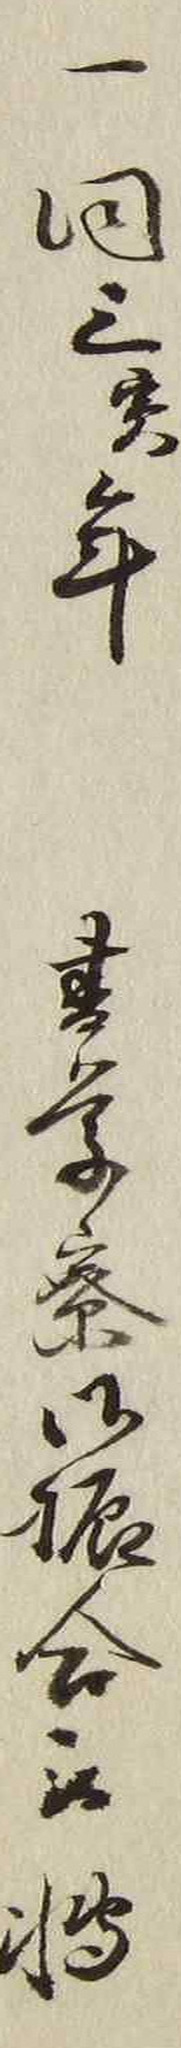一同三寅年書学寮御振合被転
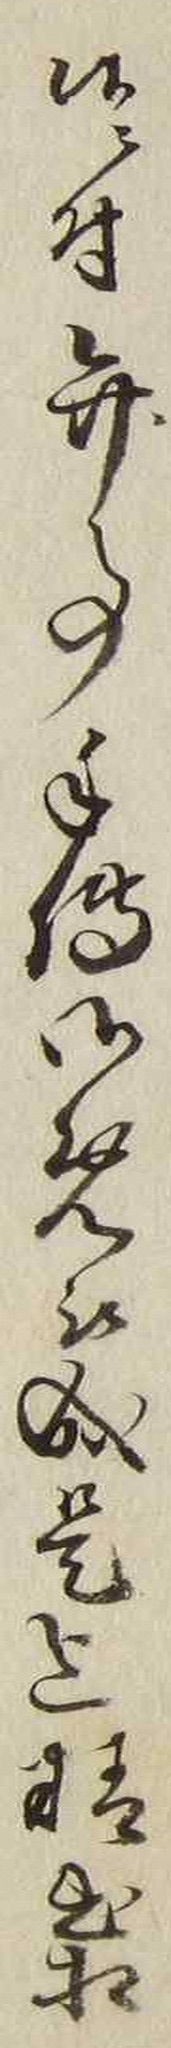候ニ付弁事手伝御免被成是迄精出相

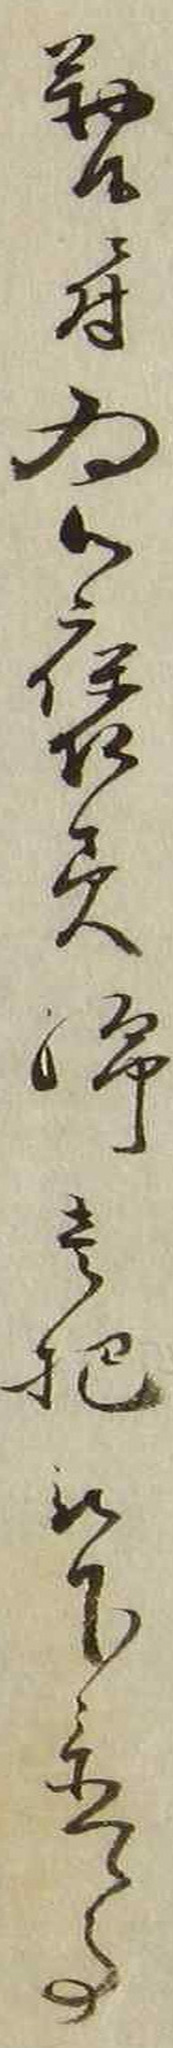勤候ニ付為御褒美綿壱把被下置候事
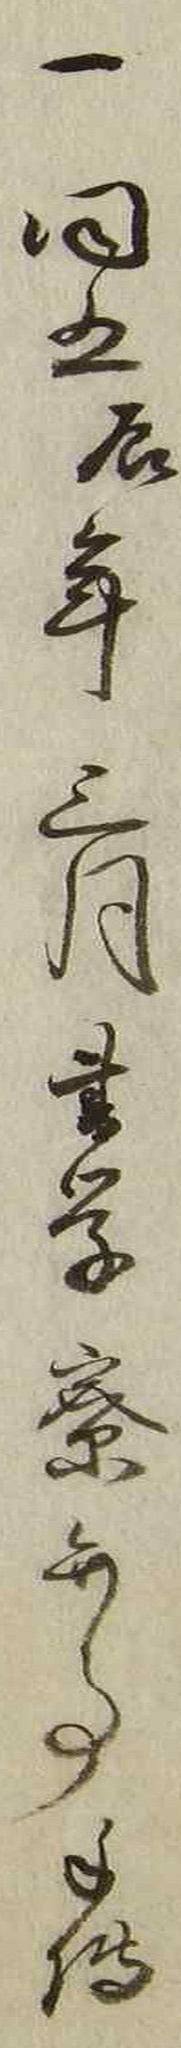一同五辰年三月書学寮弁事手伝
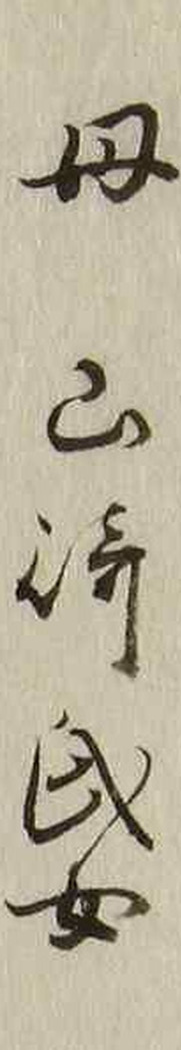母山崎氏女
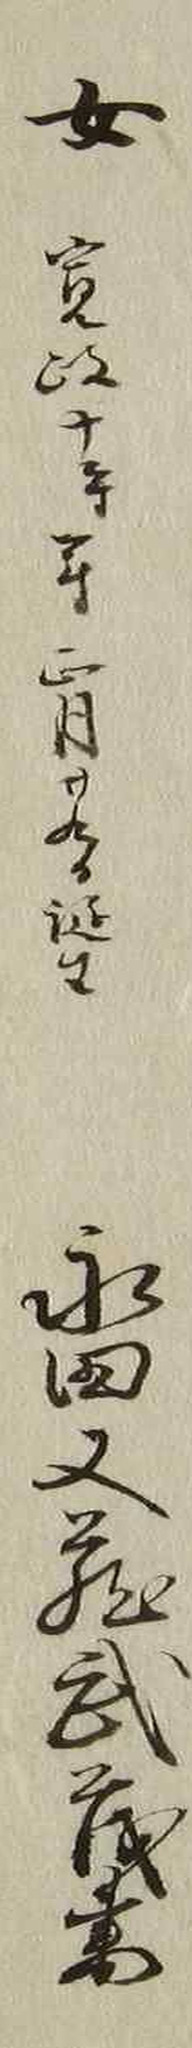寛政十午年正月廿九日誕生永田又蔵武茂妻
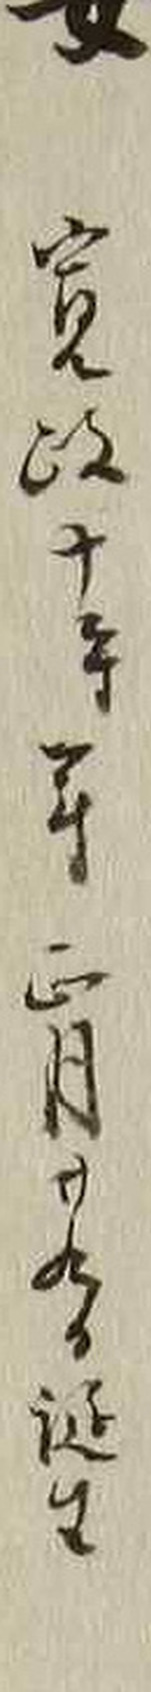寛政三亥年十月廿七日誕生
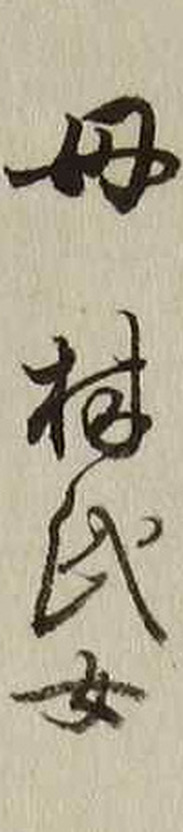母村氏女
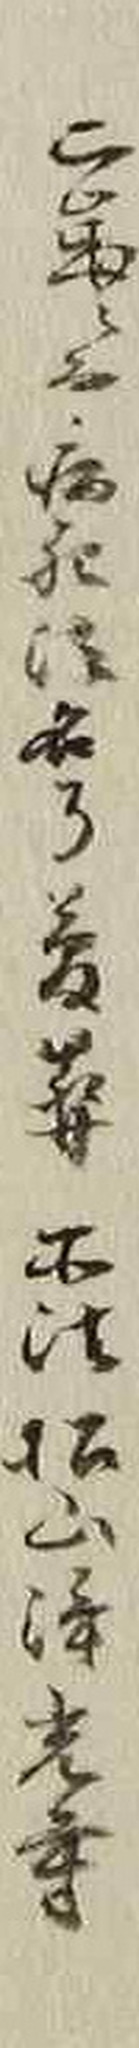二歳ニ而病死法名了葬所法招山浄光寺
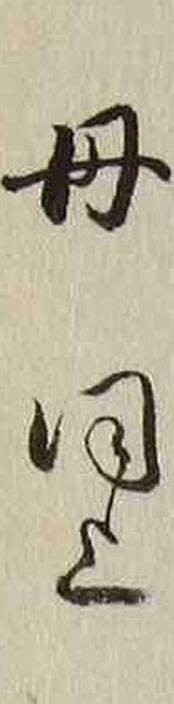母同上
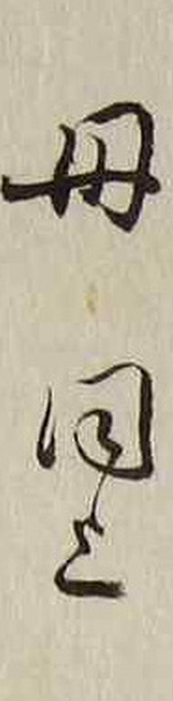母同上
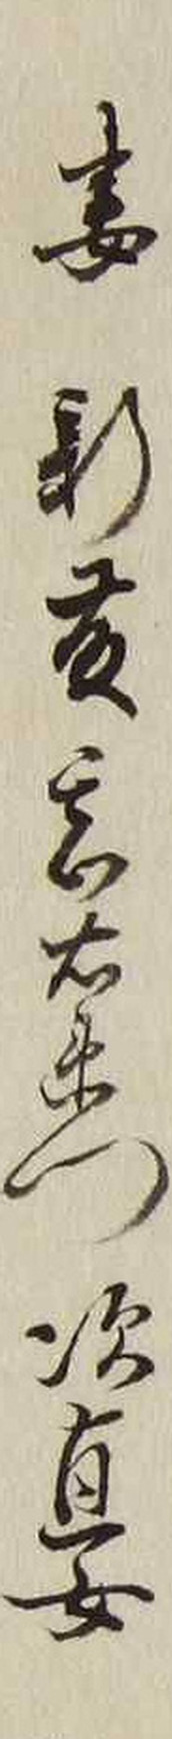妻新藤甚右衛門次直女

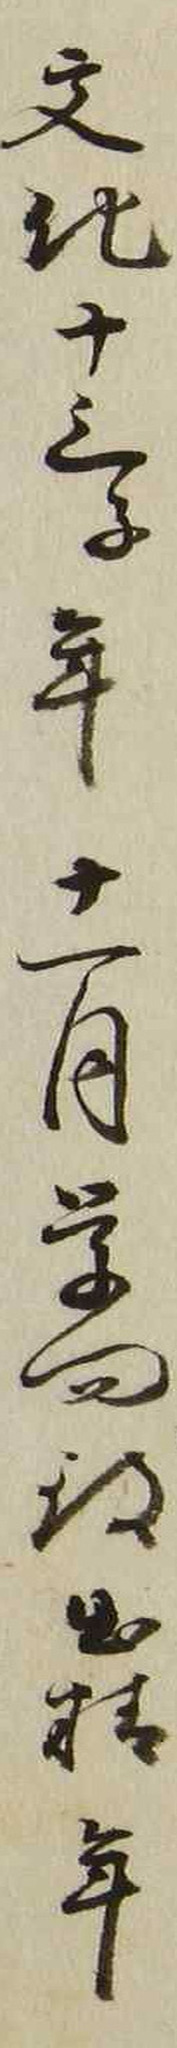文化十三子年十一月学問致出精年
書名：諸士系譜　巻之4　い之部4
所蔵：会津若松市立会津図書館
